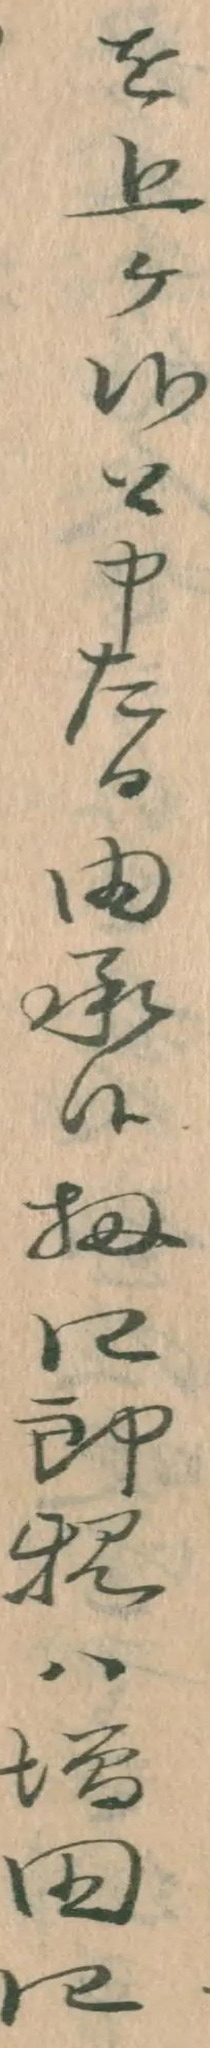を上け候と申たる由承候扨四郎親は増田四
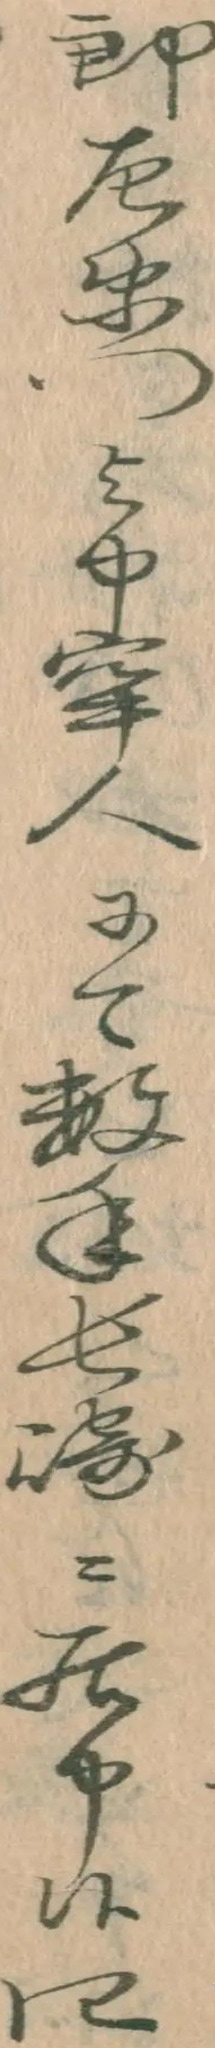郎左衛門与申牢人尓て数年長崎に居申候四
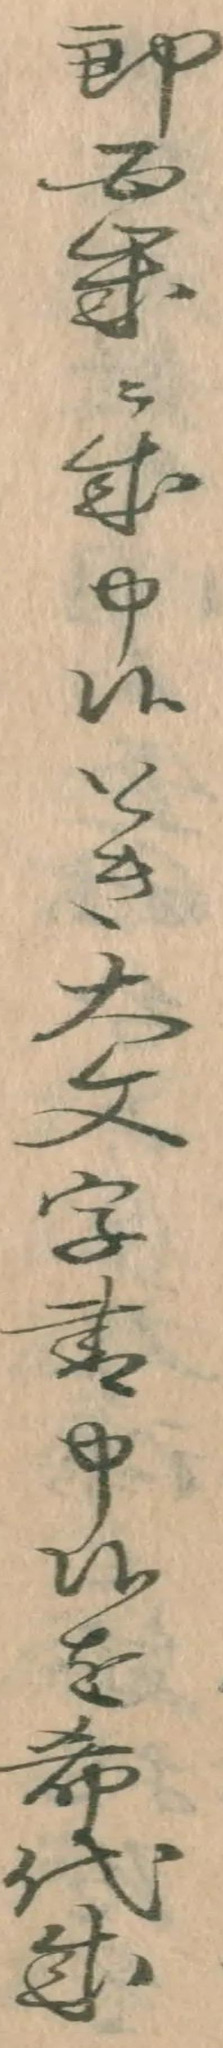郎五歳に成申候とき大文字書申候を希代成
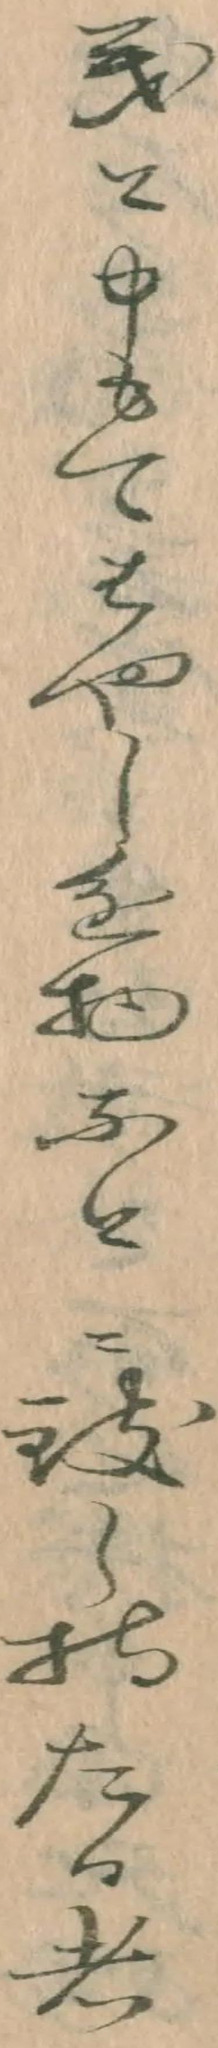義と申もて者やし進物なとに致し持たる者
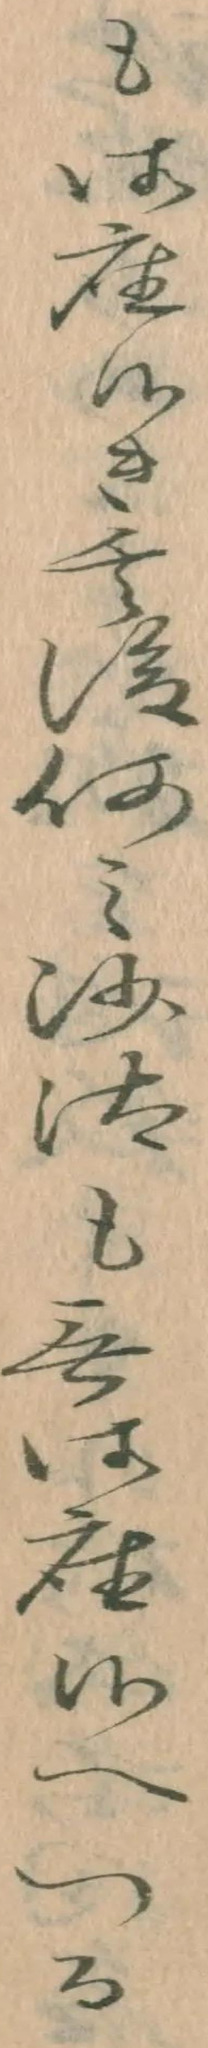も御座候き其後何之沙汰も無御座候へつる
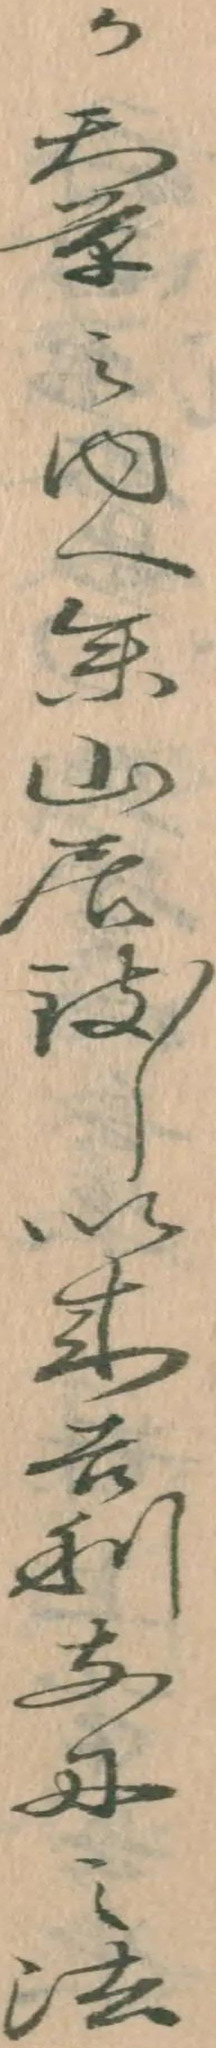か天草之内へ参山居致し以来吉利支丹之法
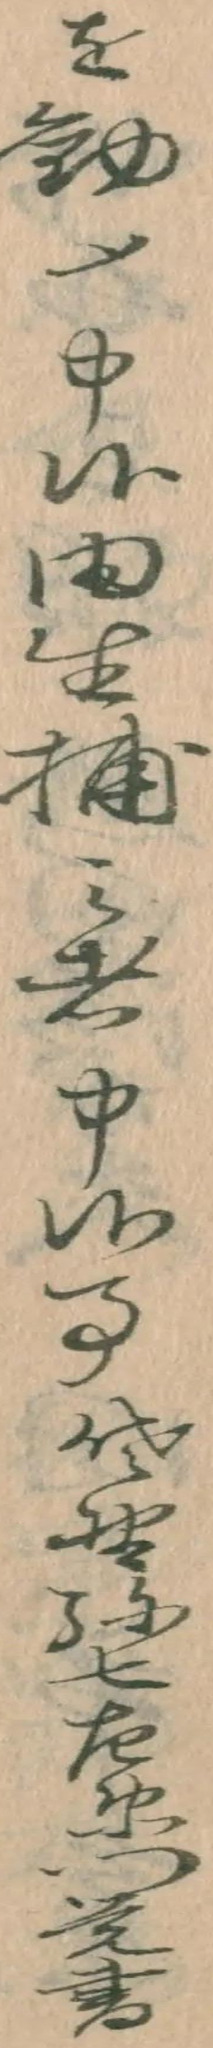を勧め申候由生捕之者申候事佐野弥七左衛門覚書
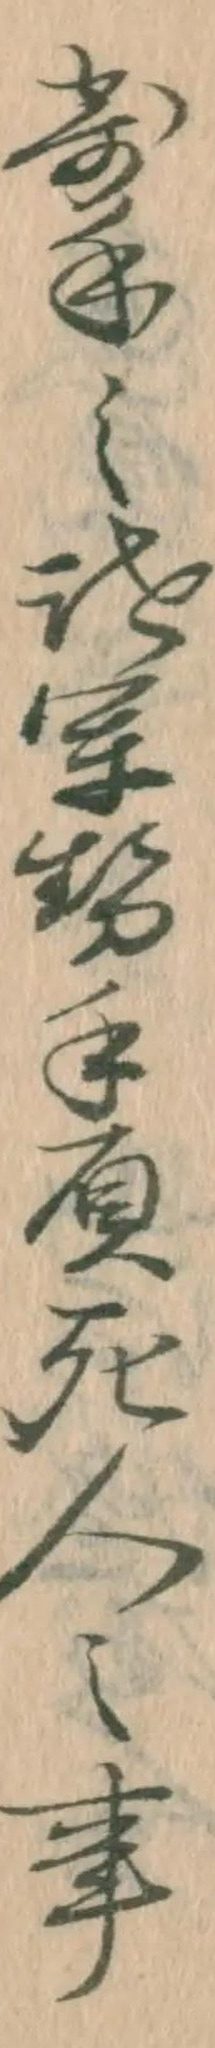寄手之諸軍勢手負死人之事
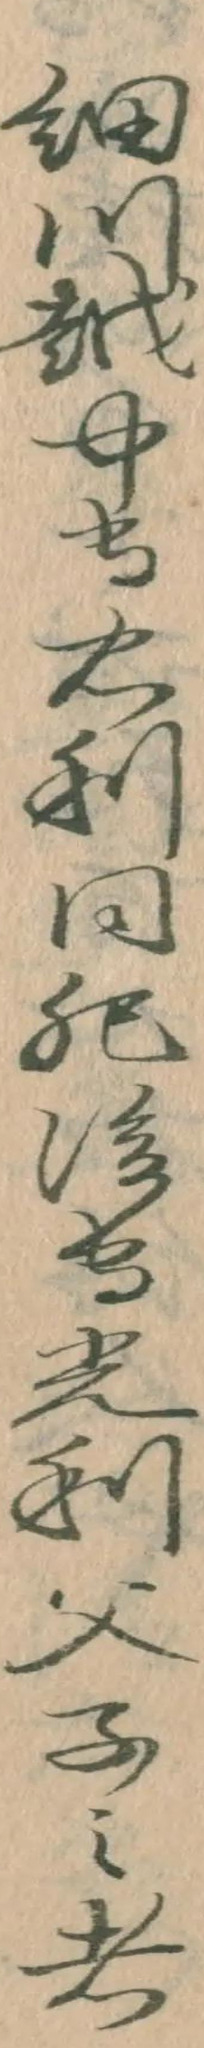細川越中守忠利同肥後守光利父子之者
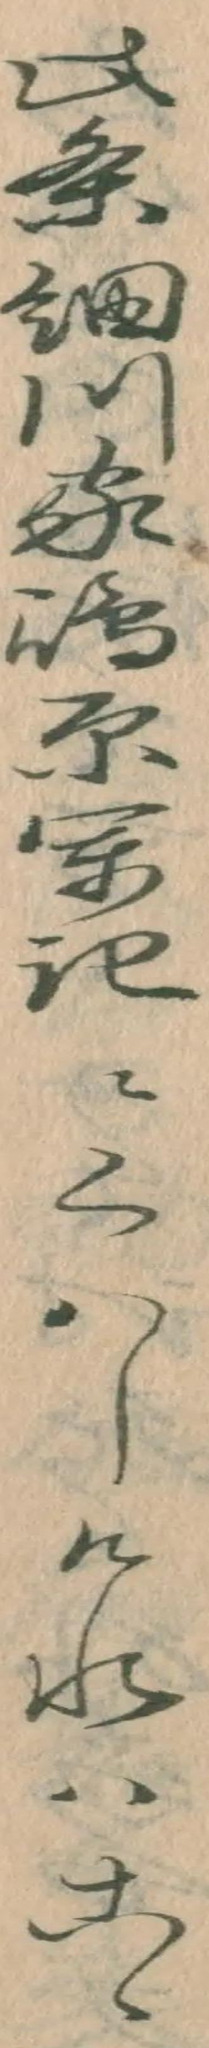此条細川家島原軍記にくはしけれは古々
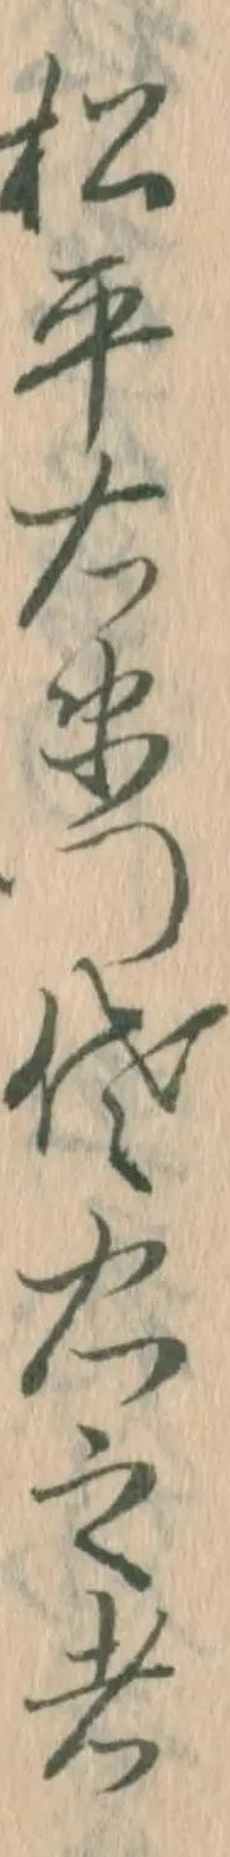松平右衛門佐忠之者
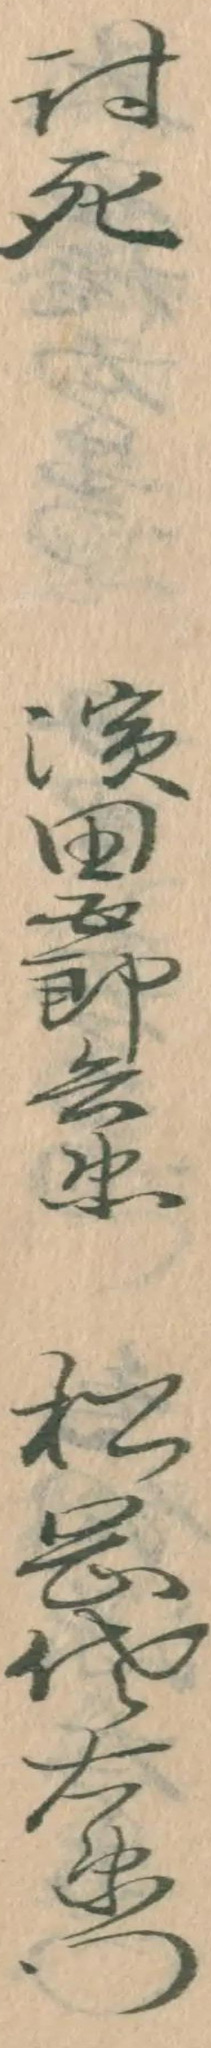討死浜田五郎兵衛松岡佐右衛門
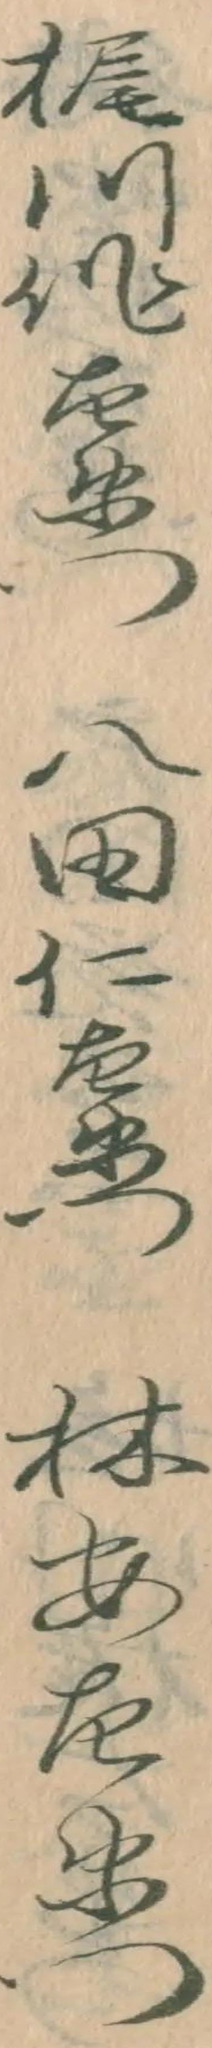梶川作左衛門八田仁左衛門林安左衛門

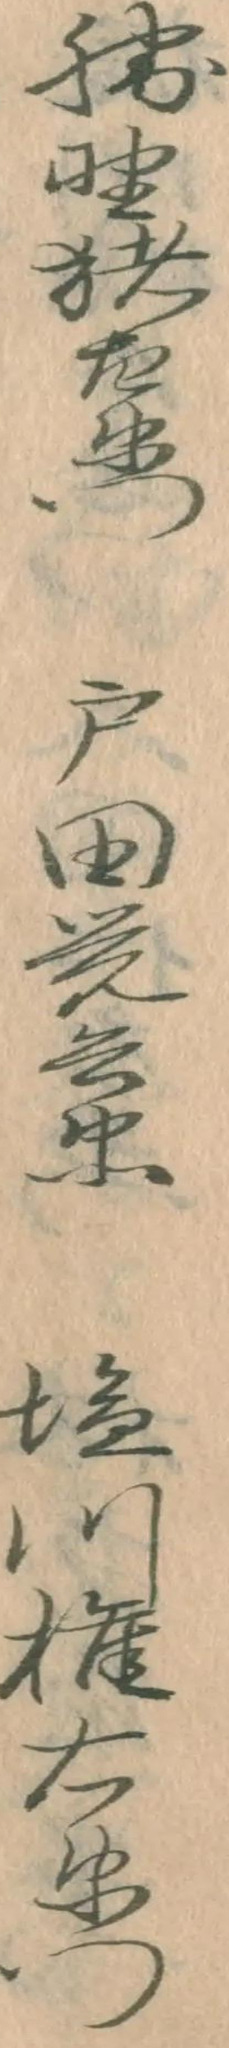勝野猪左衛門戸田覚兵衛塩川権右衛門
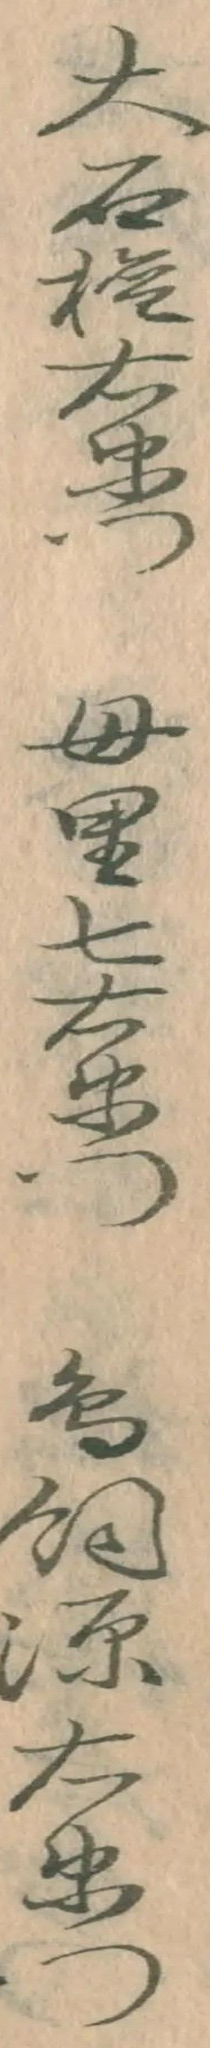大石権右衛門母里七右衛門鳥飼限右衛門
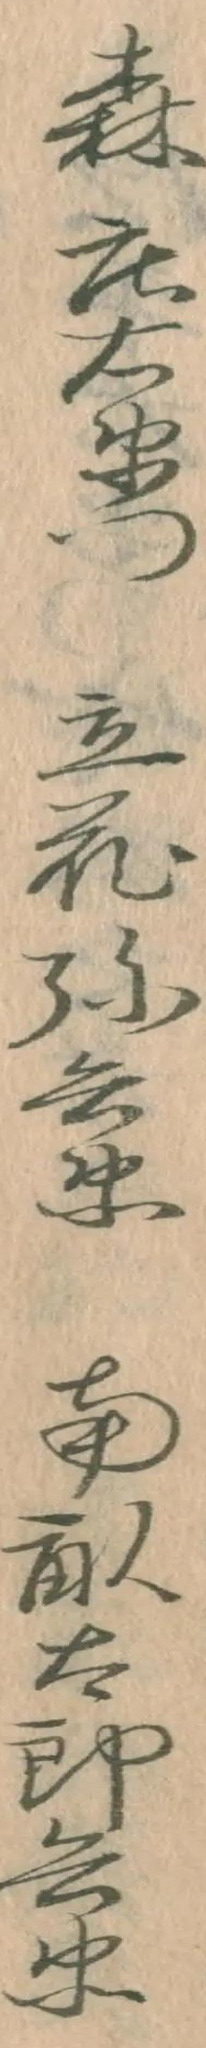森庄右衛門立花夜弥兵衛南畝太郎兵衛
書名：切支丹御退治記 49巻. [9]
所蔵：国立国会図書館 National Diet Library, JAPAN
